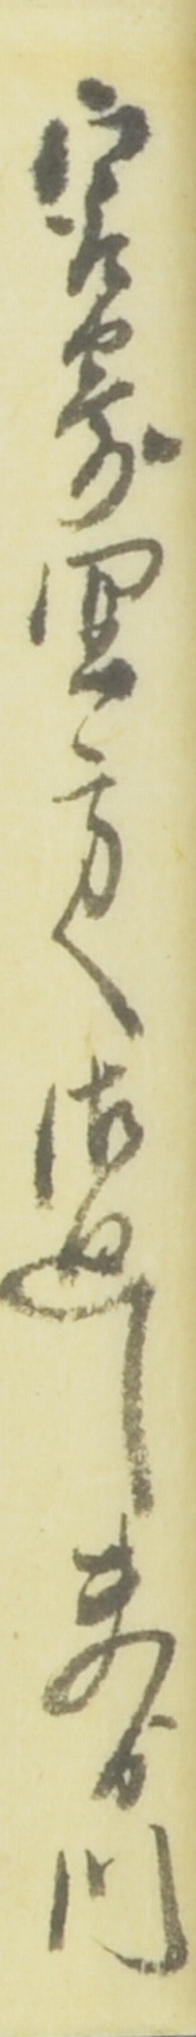最寄方へ御廻し夫ゟ川
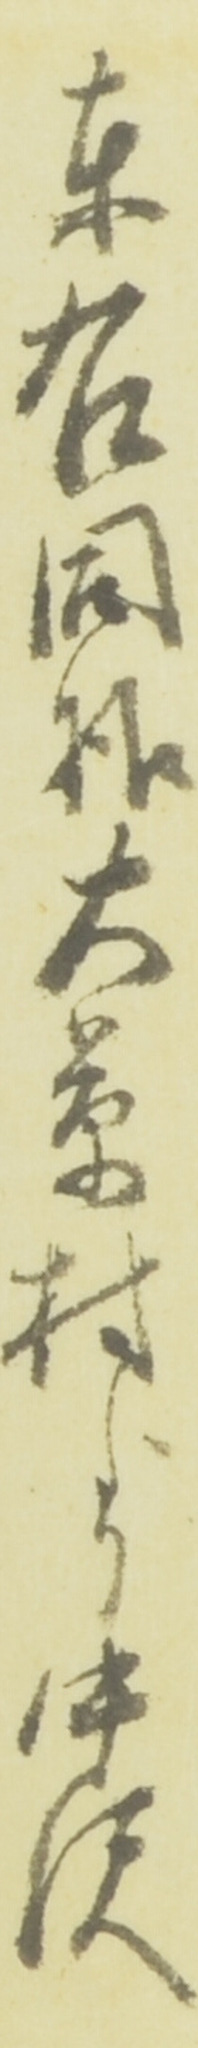東右同様大暮村より中沢
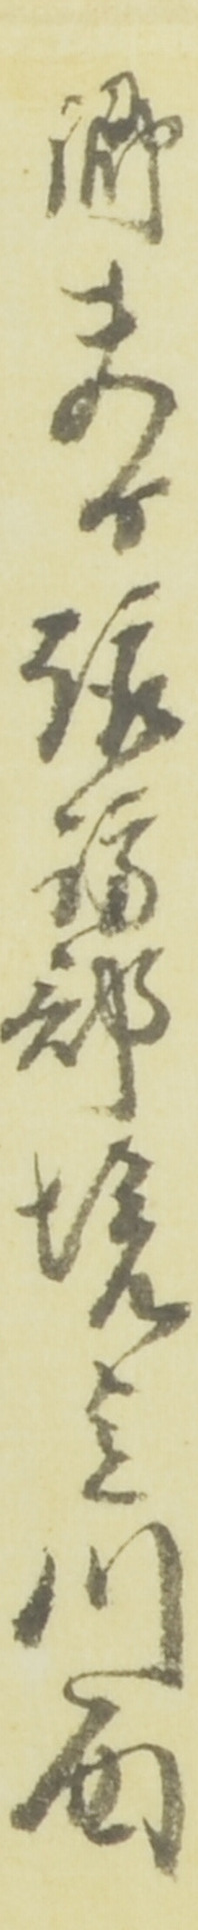郷夫ゟ諏訪郡境迄川西
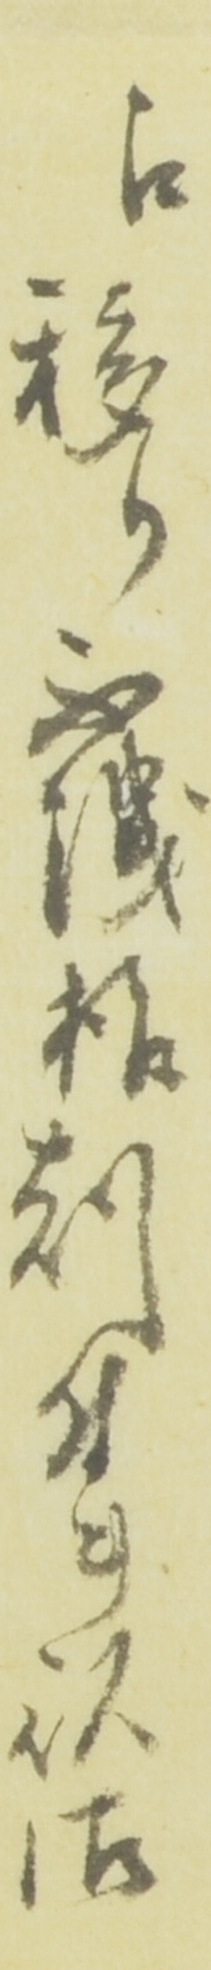江移り不洩様刻付ヲ以御
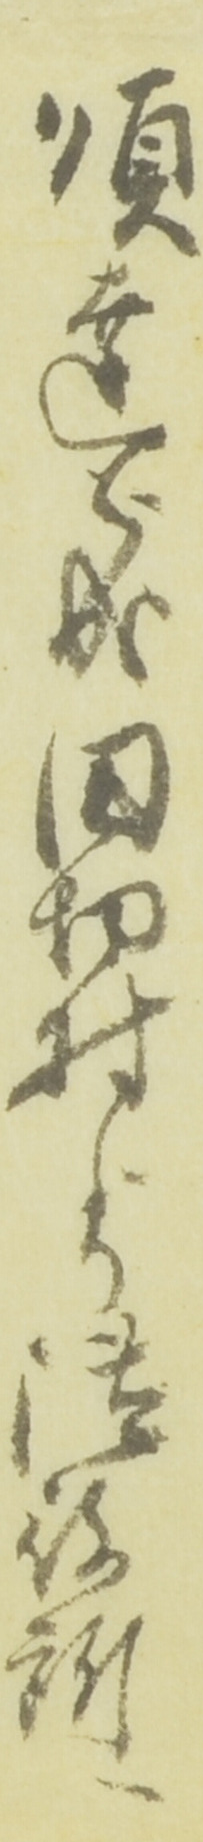順達被成田切村より御役所へ
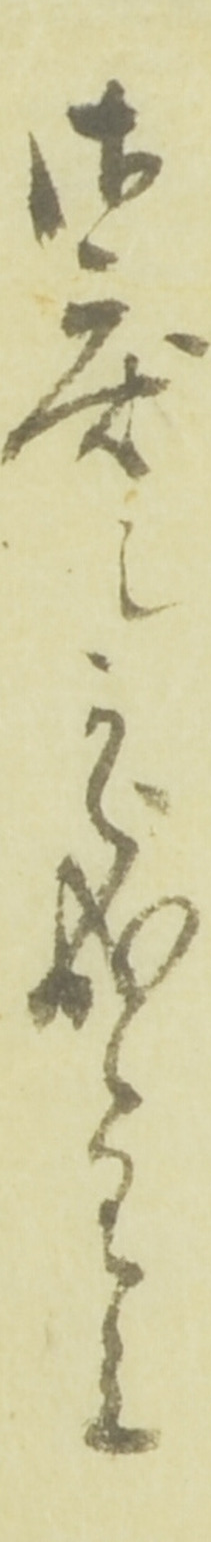御戻シ可被候已上
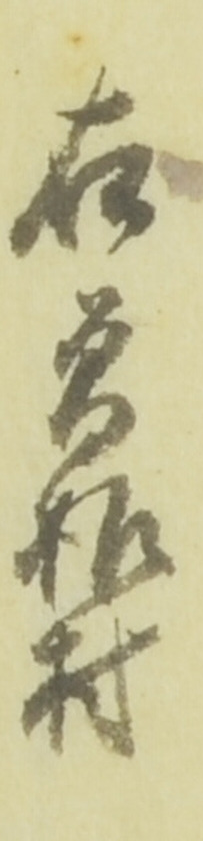右曽根村
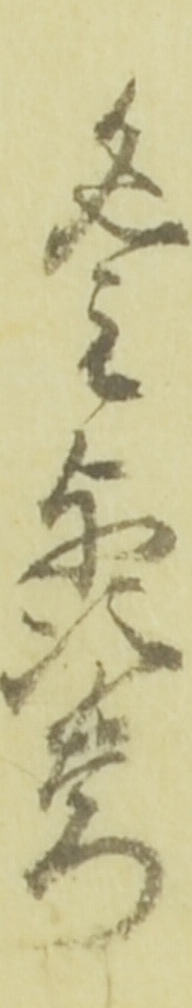名主与次右衛門
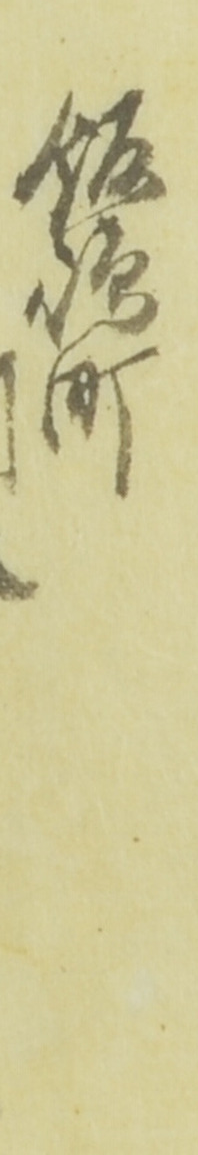飯嶋町
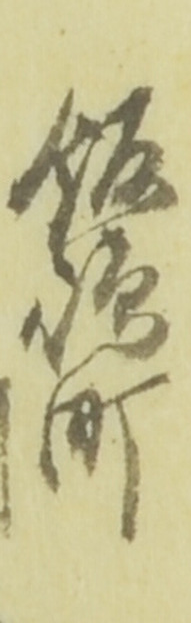飯嶋町
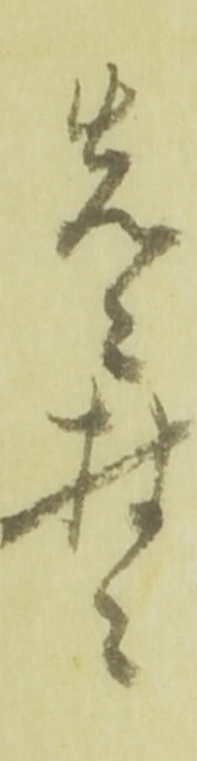先々村々
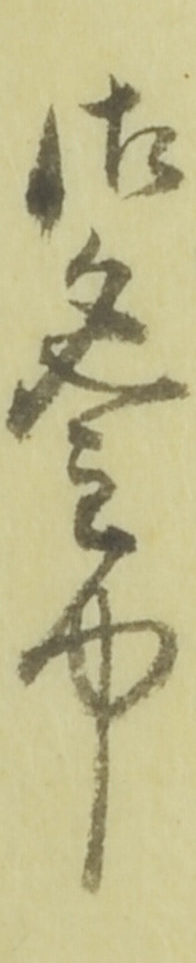御名主中
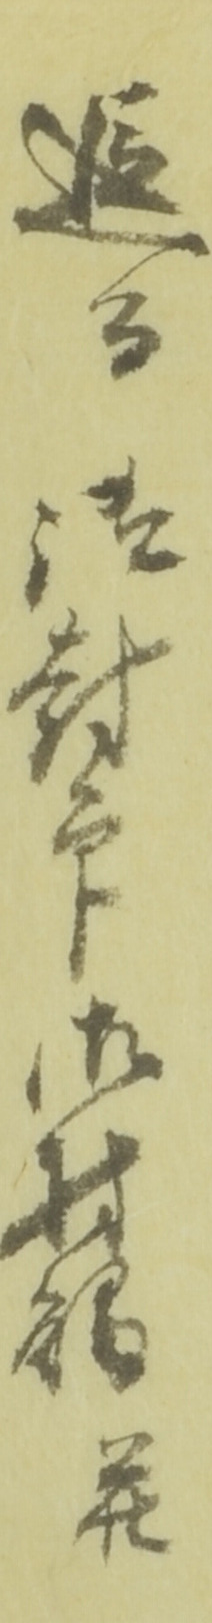追而御封印御村触并
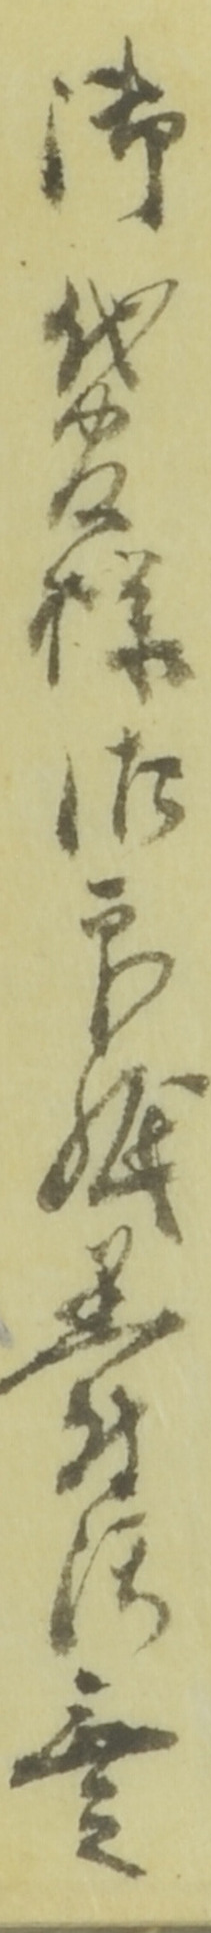御代官様御印紙黒付汚無之
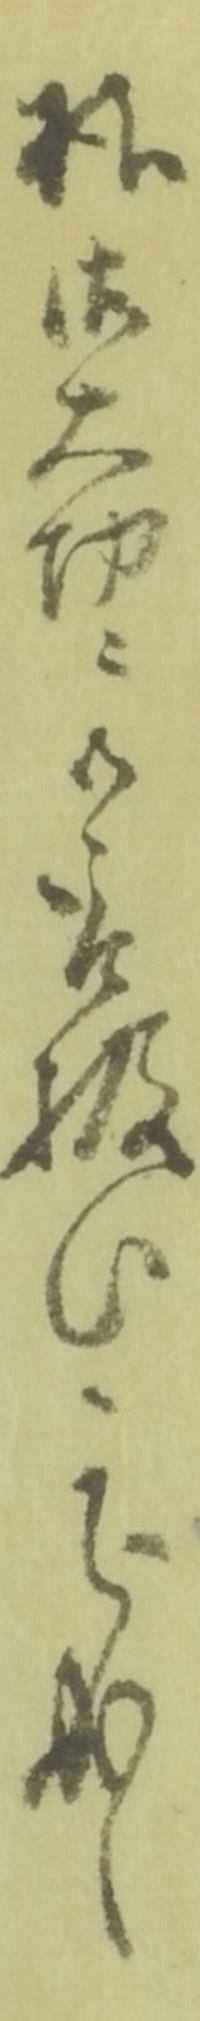様御大切に御取扱ひ可被成候
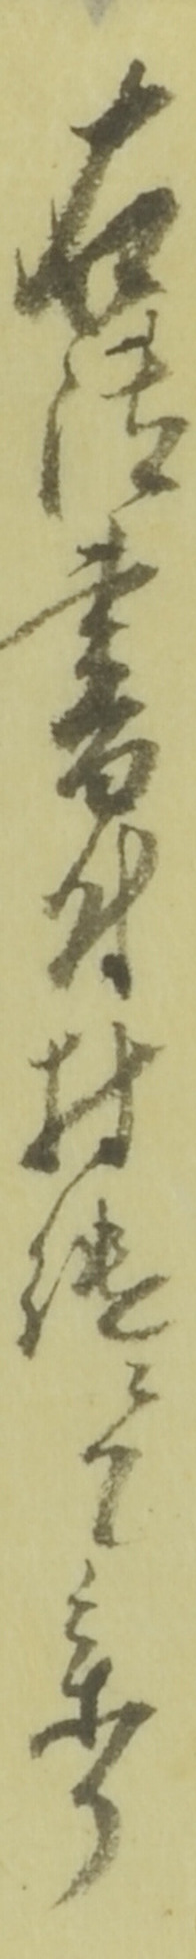右御書付村継ニて参り
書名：御触書御書附控
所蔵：伊那市立高遠町図書館・合同会社AMANE
